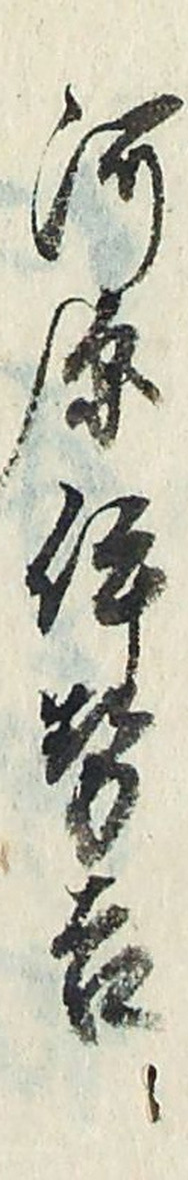河原伊勢吉
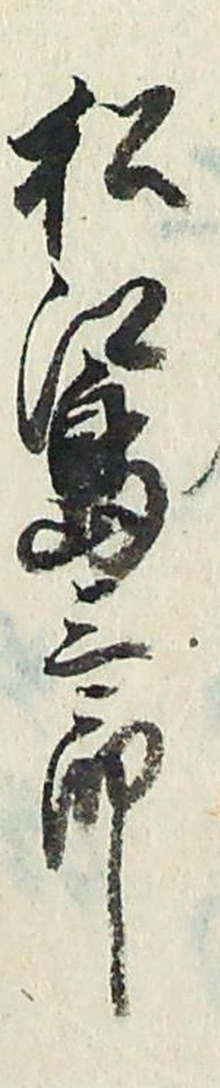松江島三郎
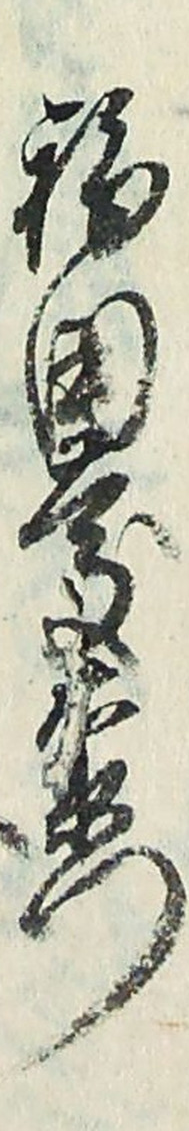福田慶右衛門
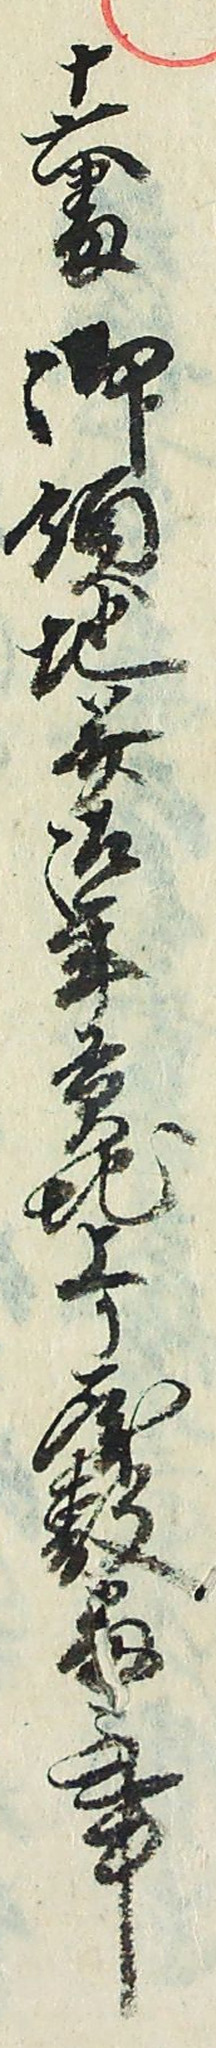十六番御領地幷御年貢地上り屋敷番之事
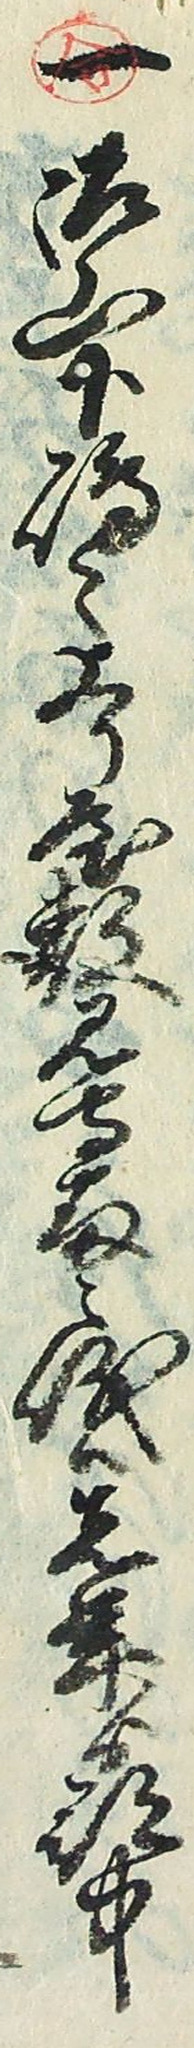一御山下嶋々上り屋敷見守番の儀は先年より郡中
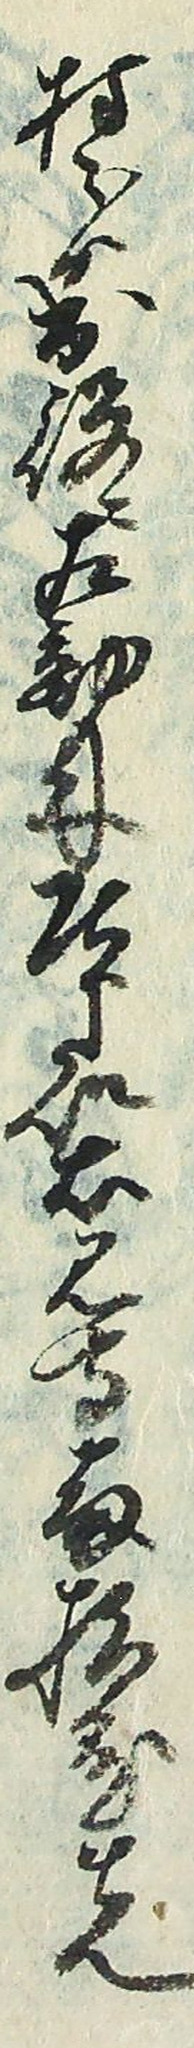村々より出役に相勤来居申処右見守番指懸先
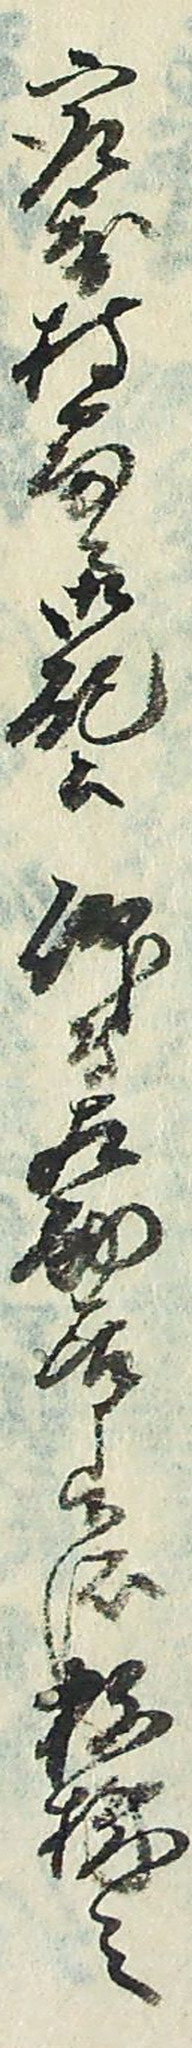最寄村番に御配被仰付相勤居申候所数株の
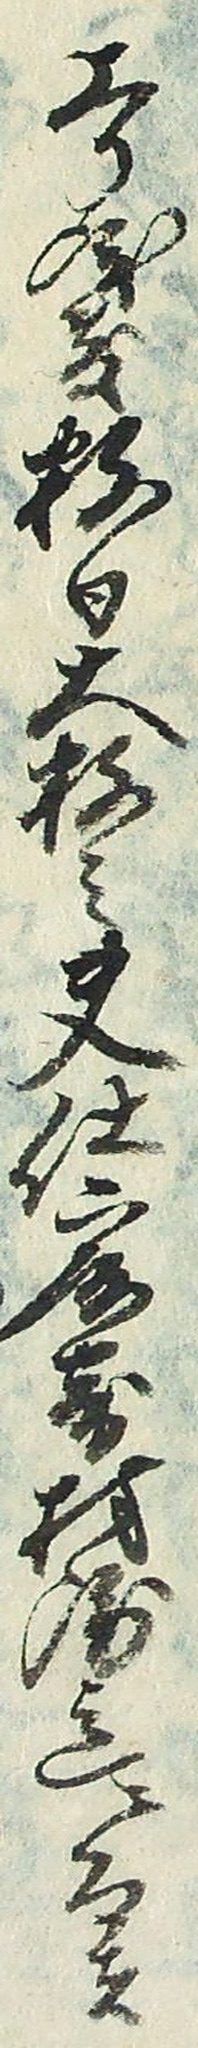上り屋敷数日大数の夫仕最寄村浦迄にては
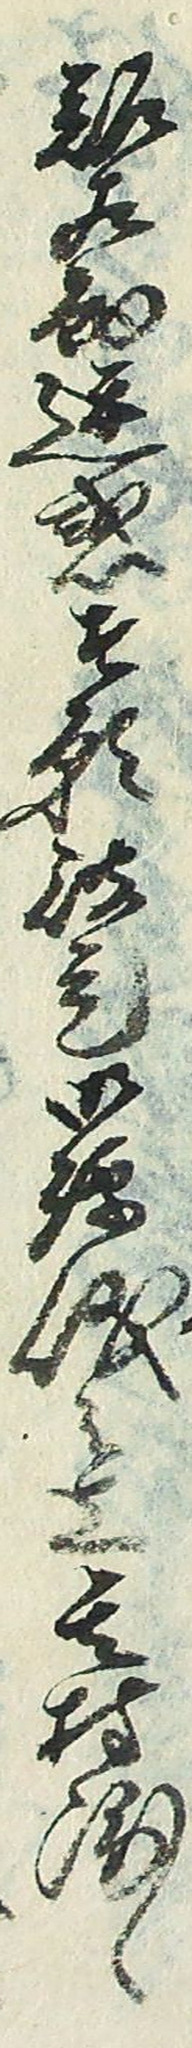難相勤迷惑奉願彼是御評儀の上其村浦々
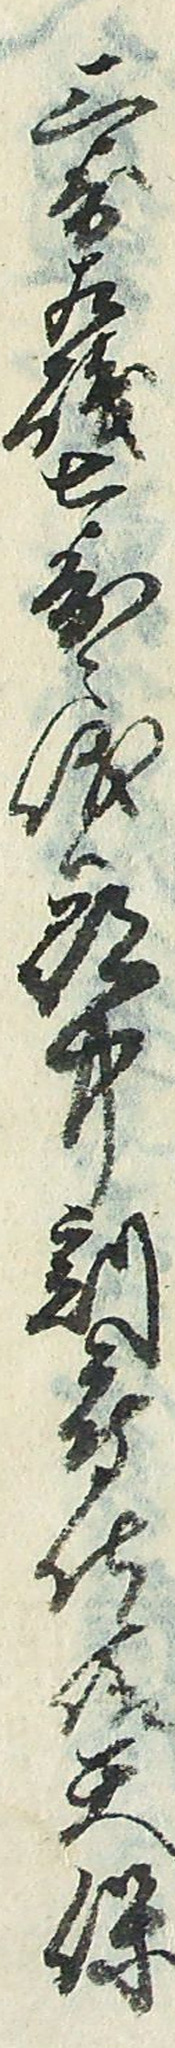三分相残七分の儀は郡中割符仕候様天保

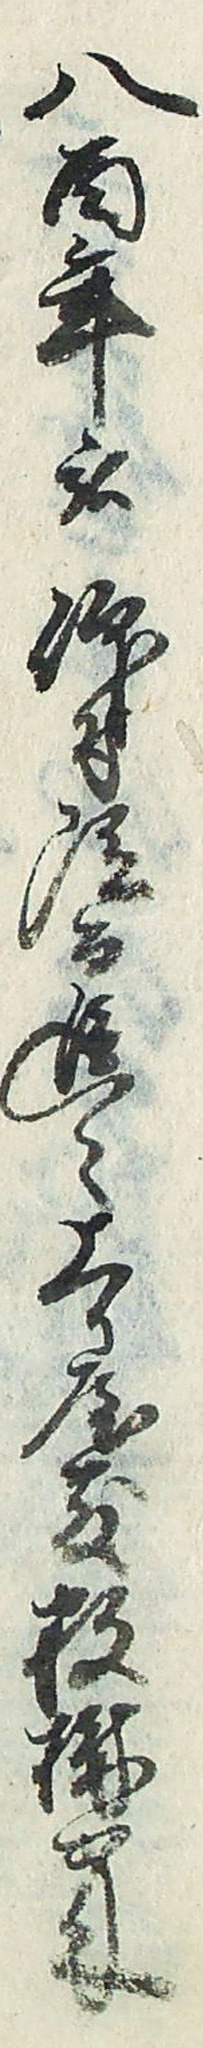八酉年被仰付随て追々上り屋敷数掛出来
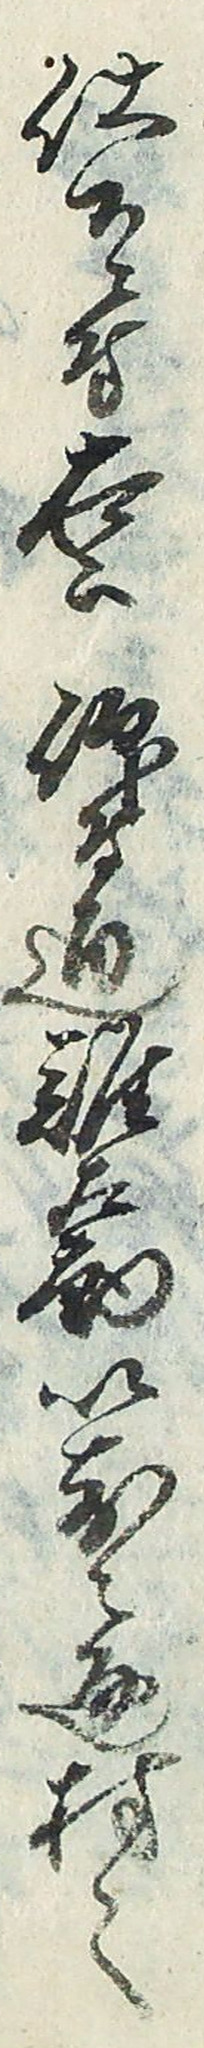仕候に付右被仰付通難相勤以前の通り村々
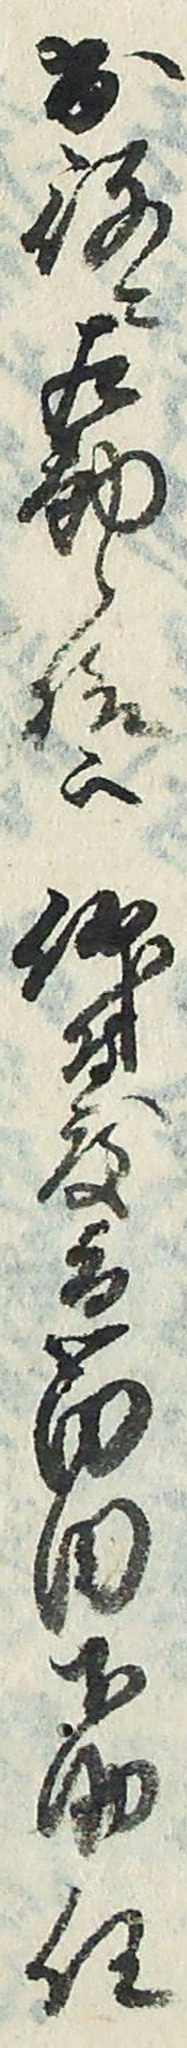出役に相勤候様被仰付度旨冨田下助任
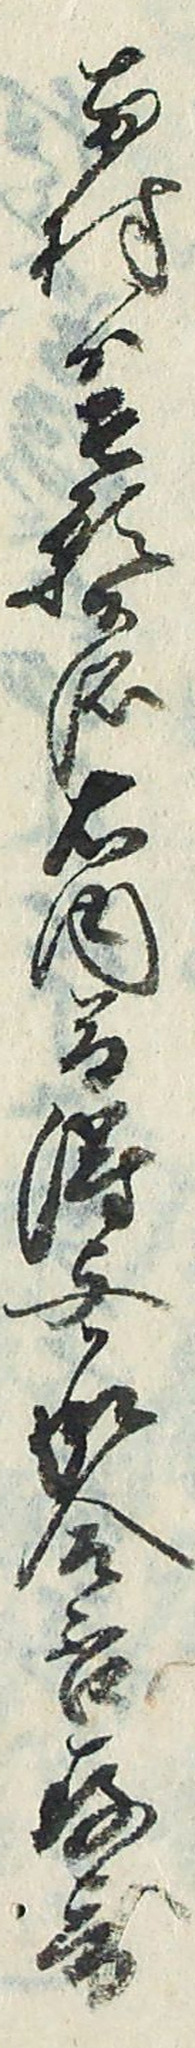両村より奉願候処右内間得与承合否存寄
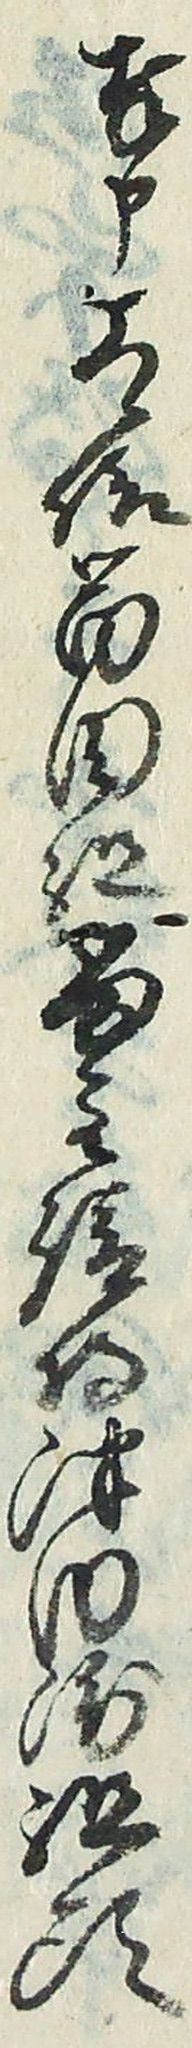奉申上候様冨田組留主請持津田浦組頭
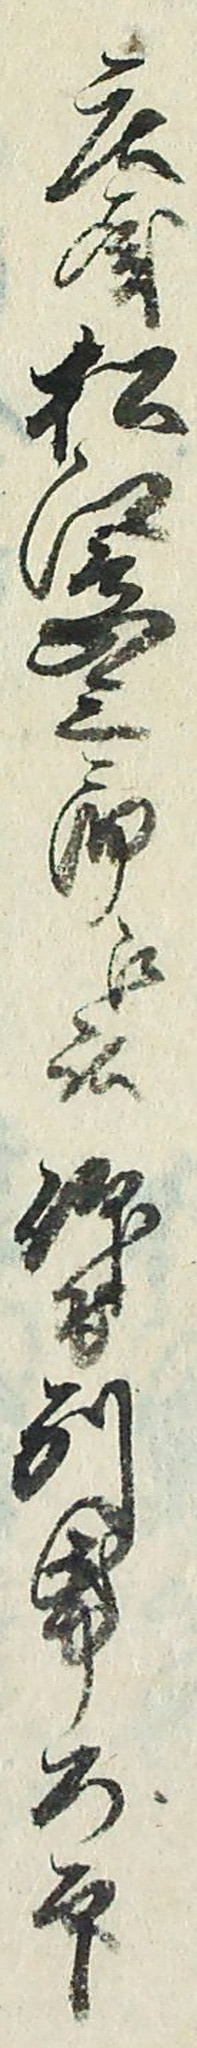庄屋松江島三郎え被仰付別紙ろ印
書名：諸割賦物賃銀定記録帳
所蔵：鳴門教育大学 Naruto University of Education
